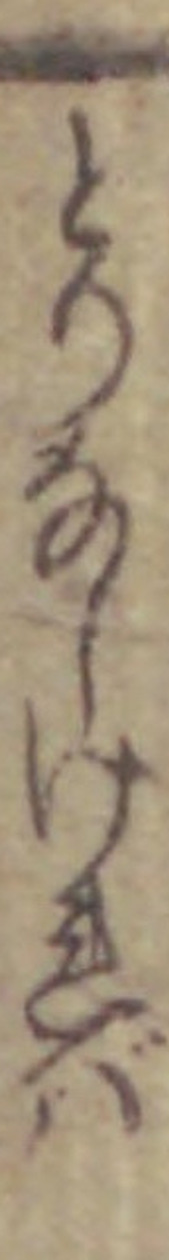とりなしければ
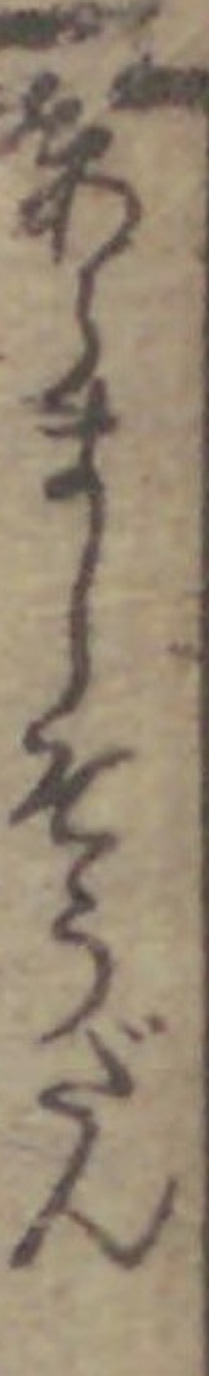あらましそうだん
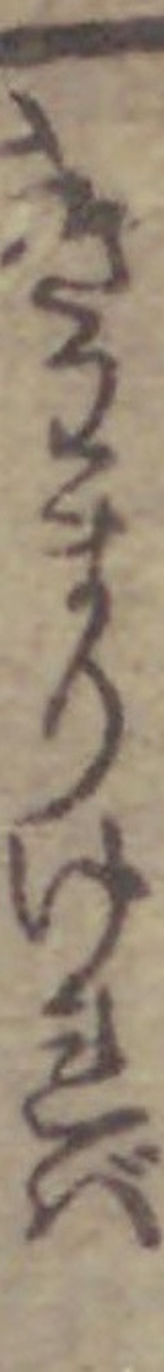きわまりければ
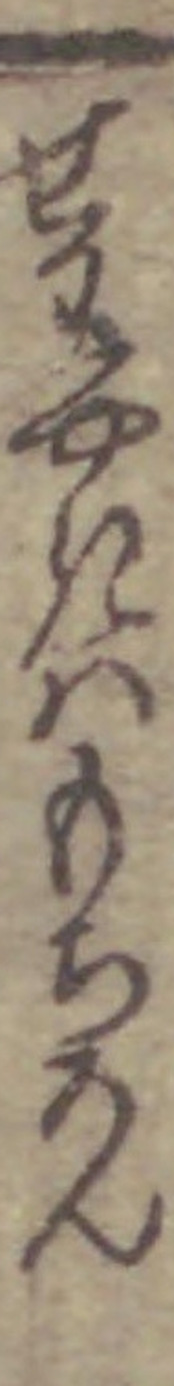せわやきはもちろん
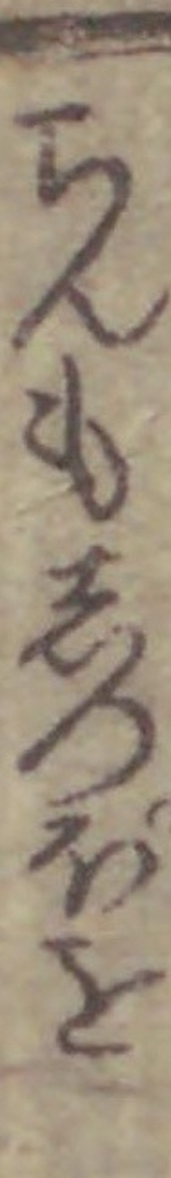ちんもしつぽを
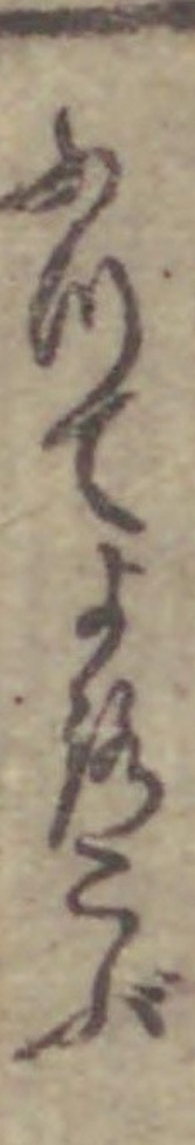ふつてよろこぶ
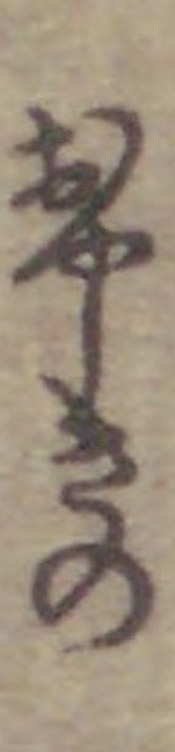おやしきの
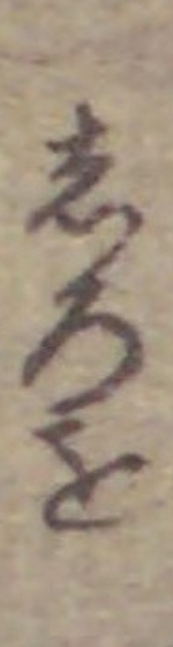しろを

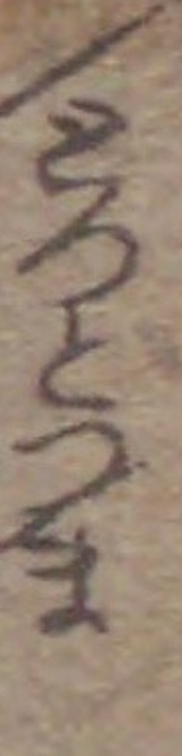とつとつま
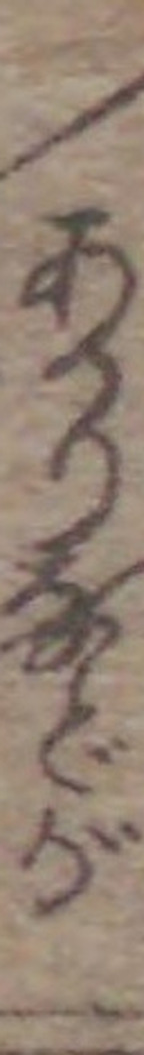あかりなどが
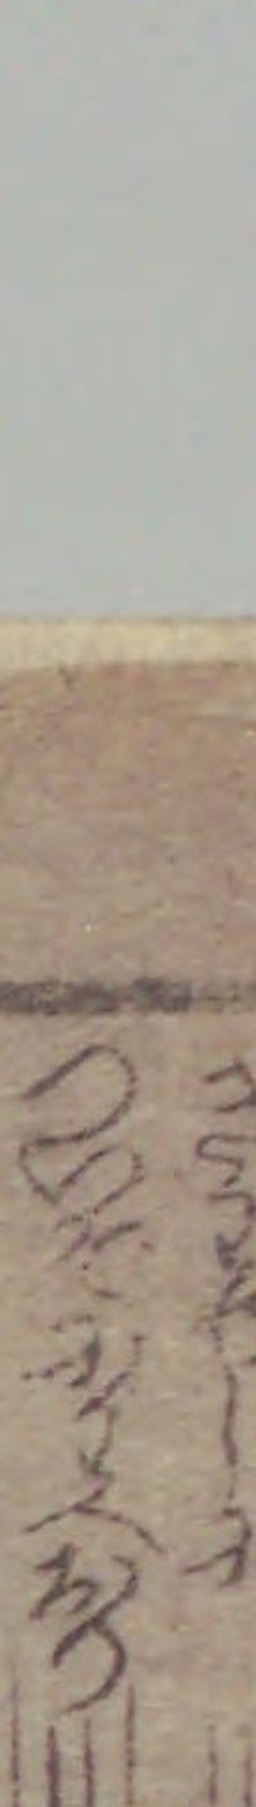ついぞにわへおり
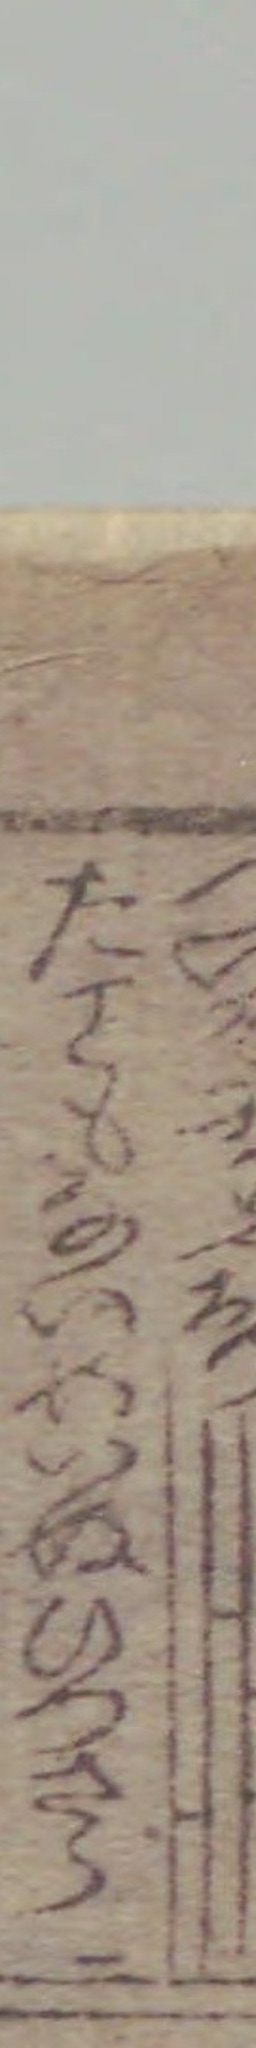たこともないめいぬひつさら
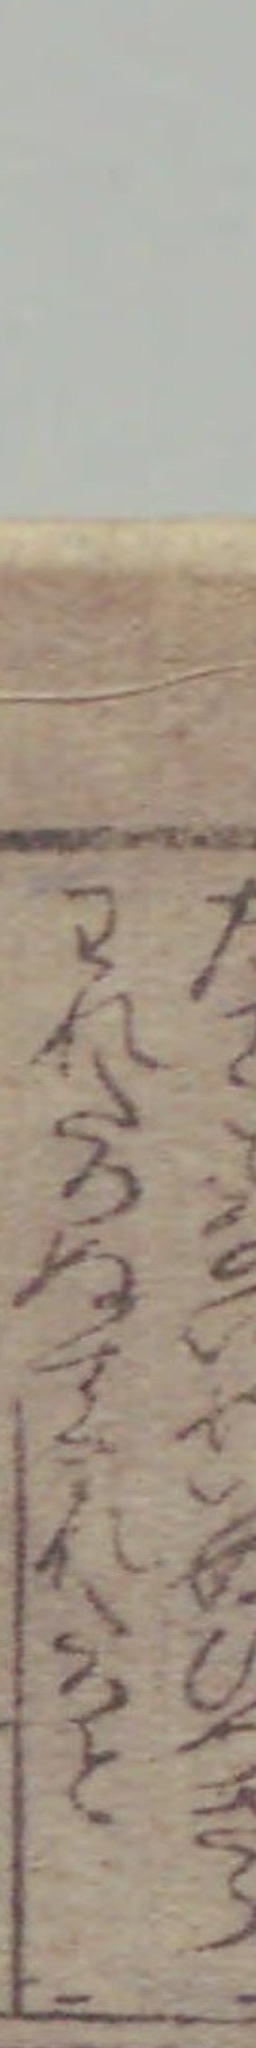われたかぬすまれたかと
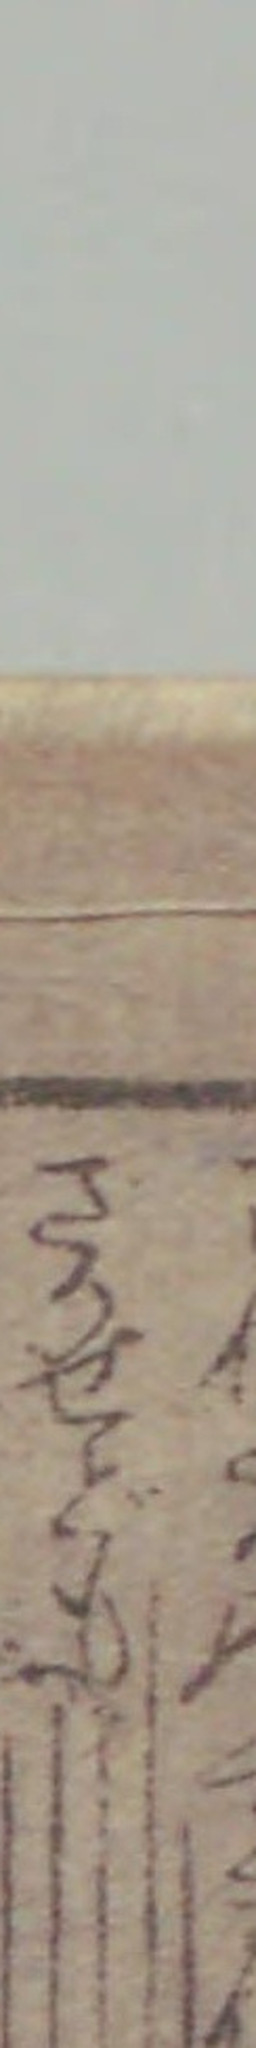さかせども
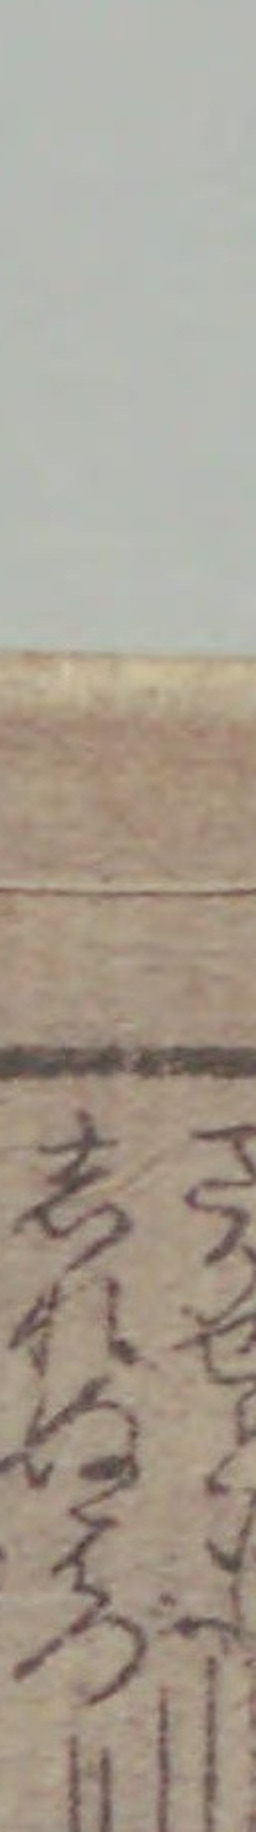しれぬはづ
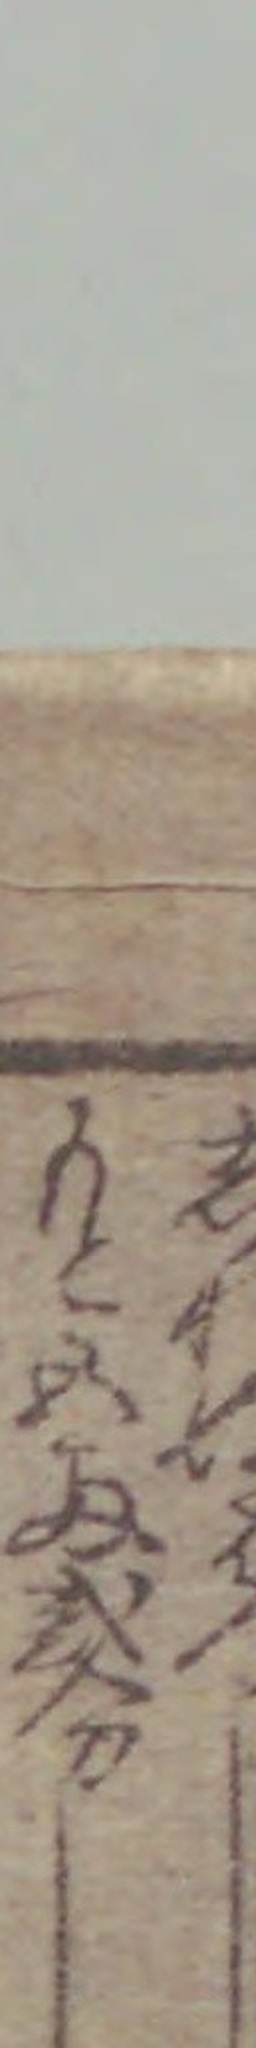もと五両貳分
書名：狆の嫁入 2巻
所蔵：国立国会図書館 National Diet Library, JAPAN
